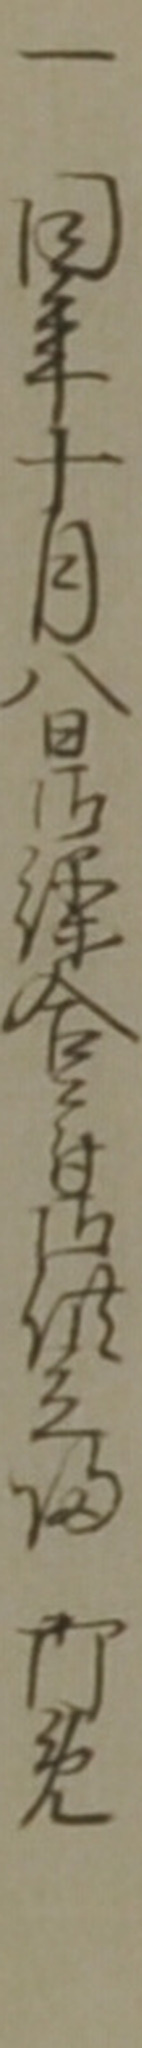一同年十月八日御繰合ニ付御供立帰御免
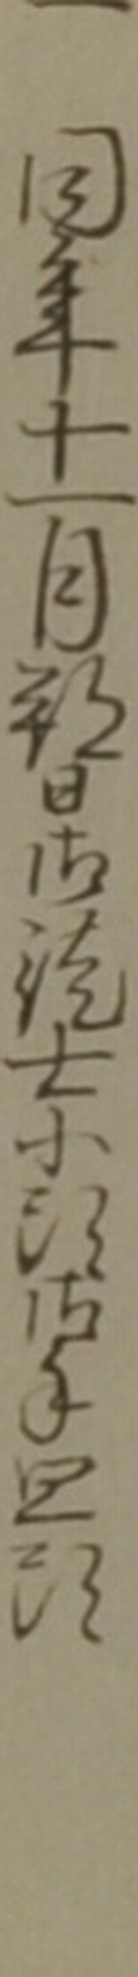一同年十一月朔日御徒士小頭御小頭
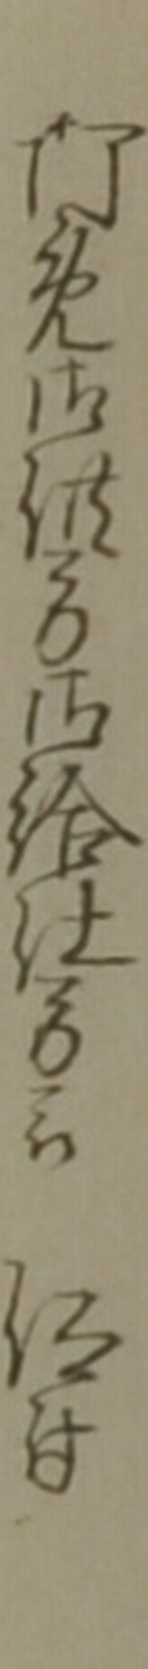御免御供方御給仕方被仰付
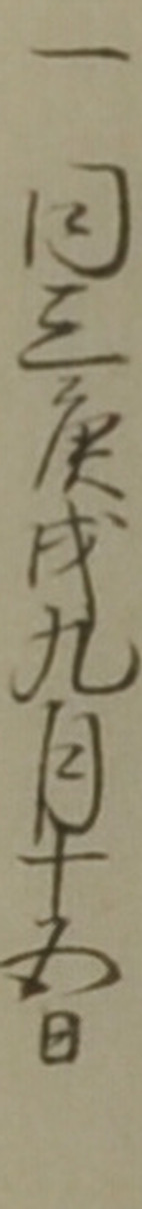一同三庚戌九月十五日
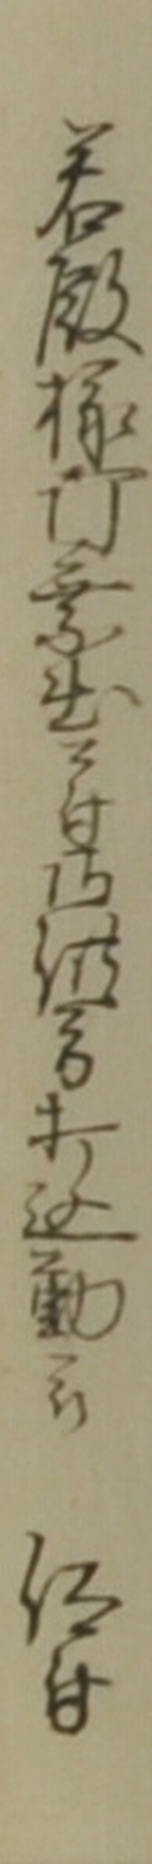若殿様御乗出ニ付御供方打込勤被仰付

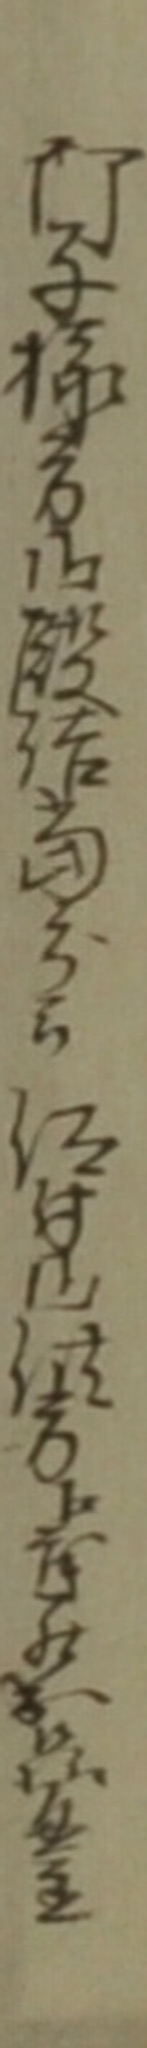御子様方御殿詰当分被仰付御供方江茂罷出候様通達
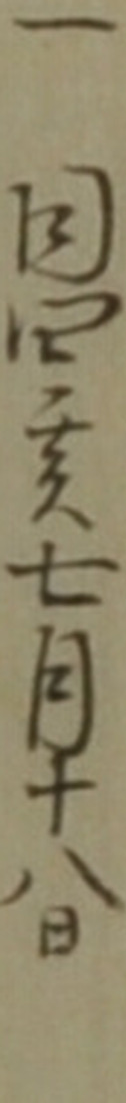一同四亥七月十八日
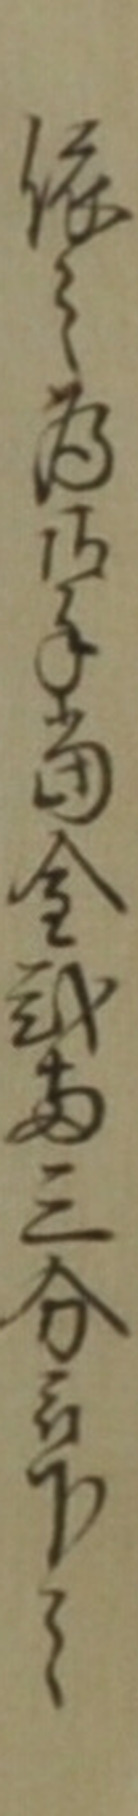依之為御手当金弐両三分被下之

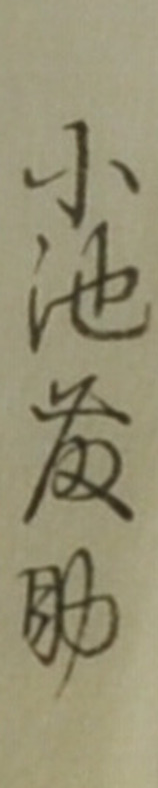小池藤助
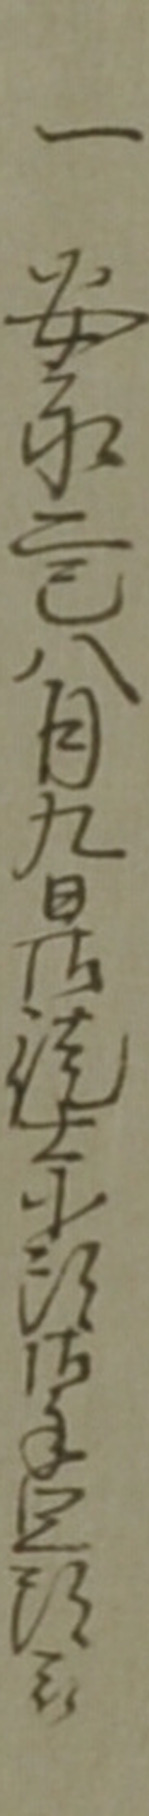一安永二巳八月九日御徒士小頭御手廻頭被
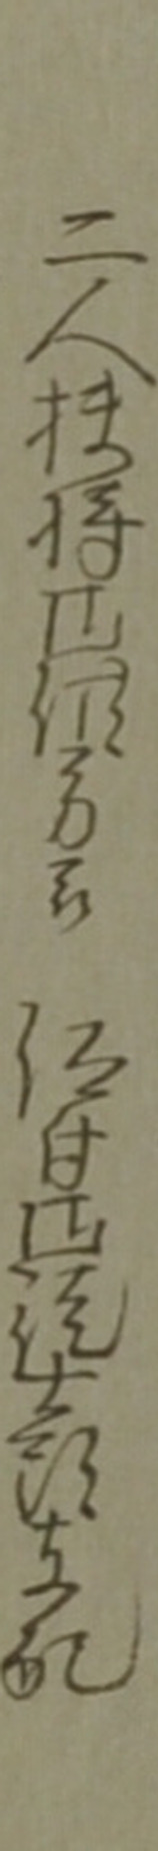二人扶持御供方被仰付御徒士頭支配
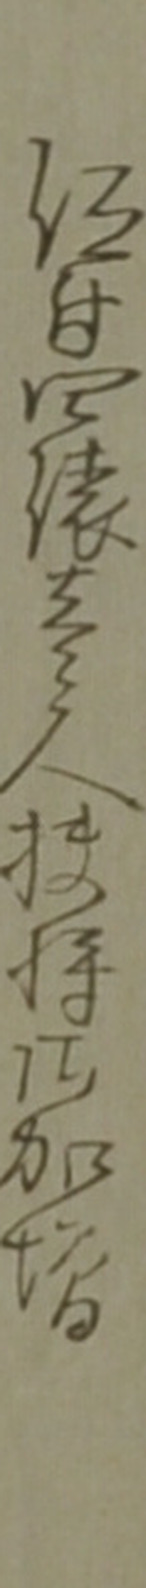仰付四俵壱人扶持御加増
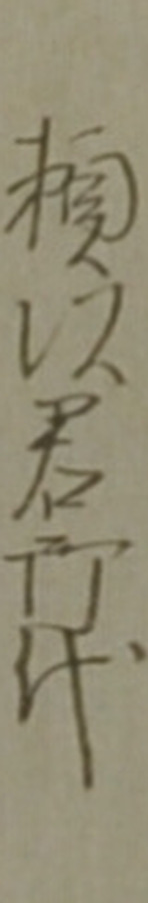頼以君御代
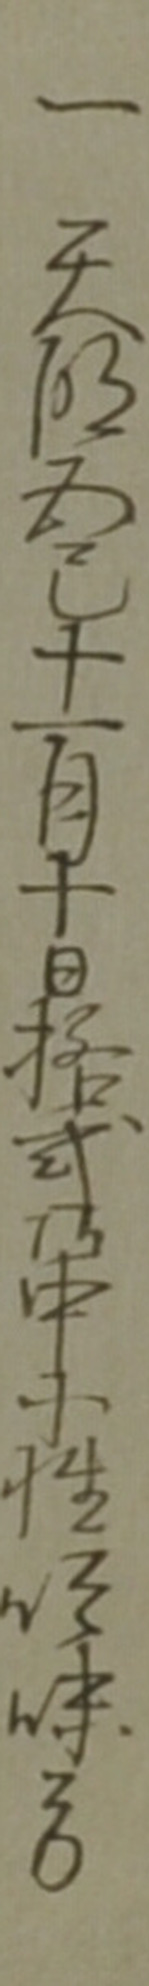一天明五巳十一月十日格式御中小性吟味方
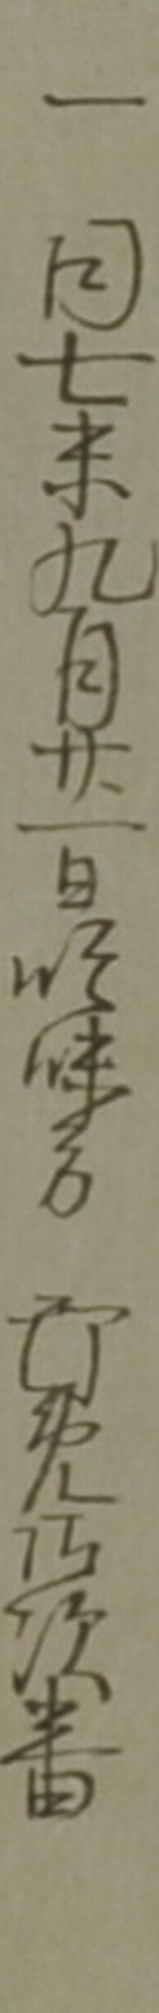一同七未九月廿一日吟味方御免御次番
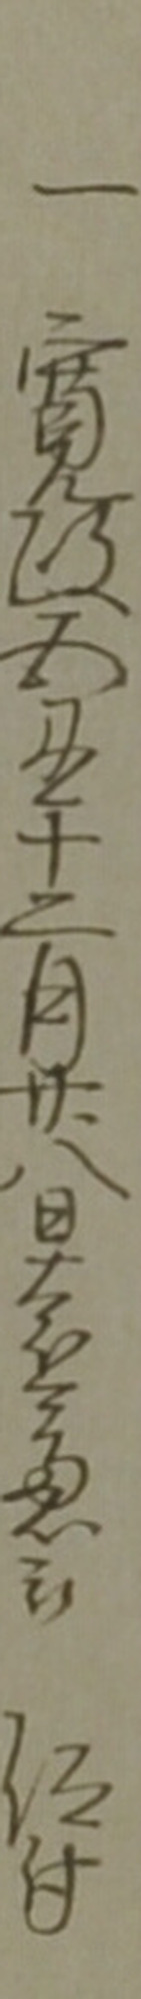一寛政五丑十二月廿八日遠慮被仰付
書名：無足諸士勤仕録（五）
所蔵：伊那市立高遠町図書館・合同会社AMANE
